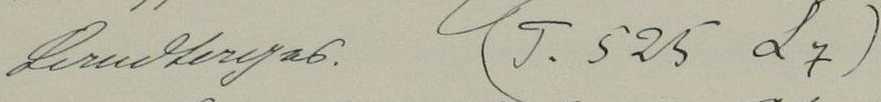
Landtages. (T.525 L7).
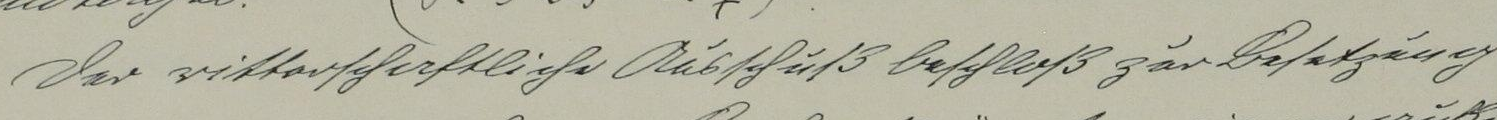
Der ritterschaftliche Ausschuß beschloß zur Besetzung
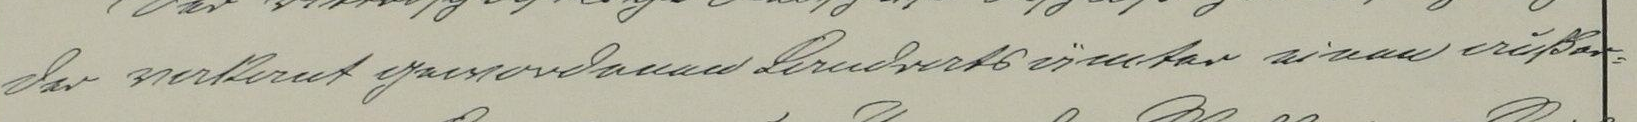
der vakant gewordenen Landratsämter einen außer-
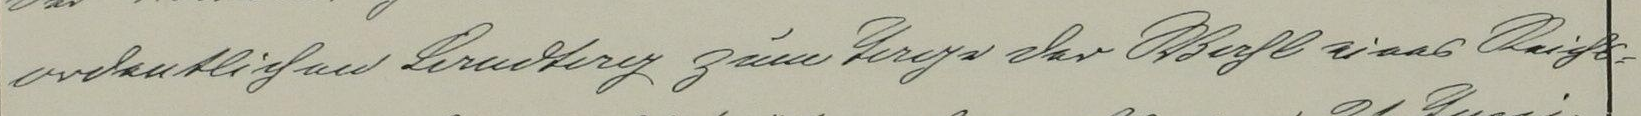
ordentlichen Landtag zum Tage der Wahl eines Reichs-
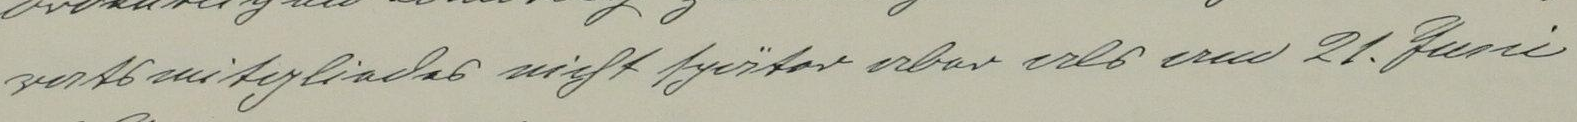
ratsmitgliedes nicht später aber als am 21. Juni
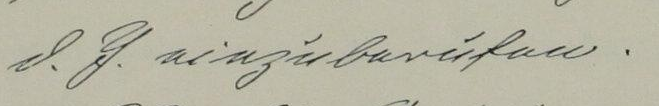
d.J. einzuberufen.
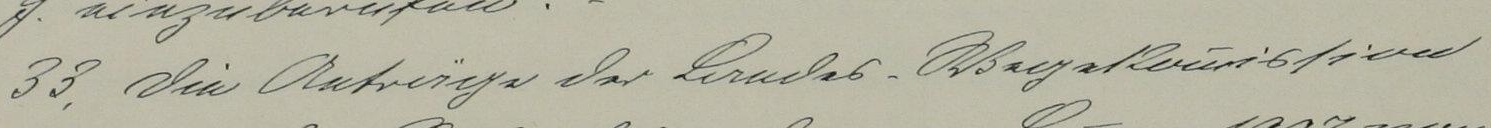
33. Die Anträge der Landes-Wegekommission
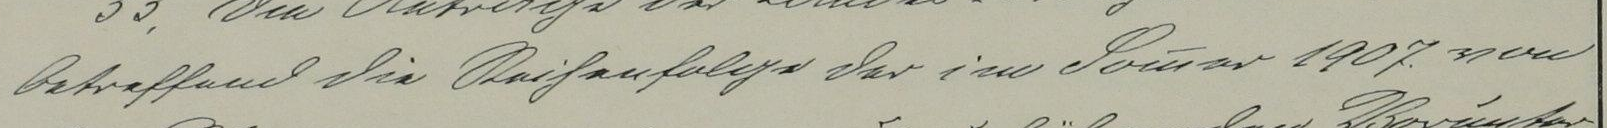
betreffend die Reihenfolge der im Sommer 1907. von
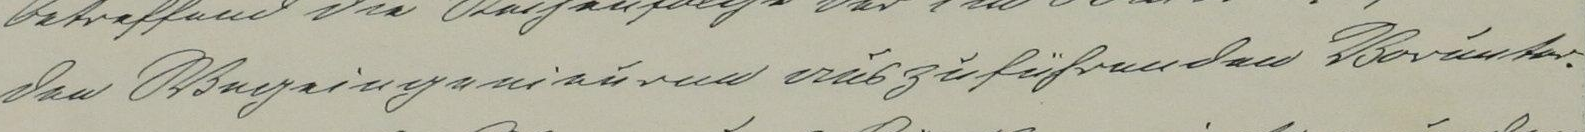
den Wegeingenieuren auszuführenden Vorunter-
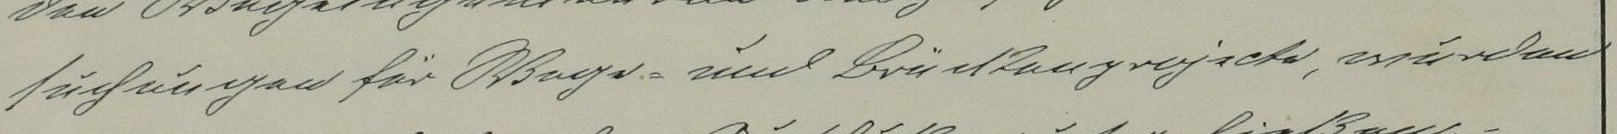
suchungen für Wege- und Brückenprojecte, wurden
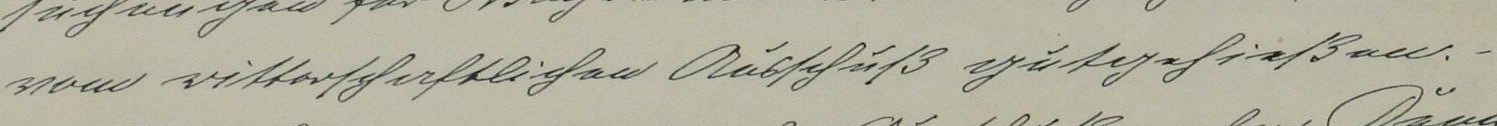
vom ritterschaftlichen Ausschuß gutgehießen.
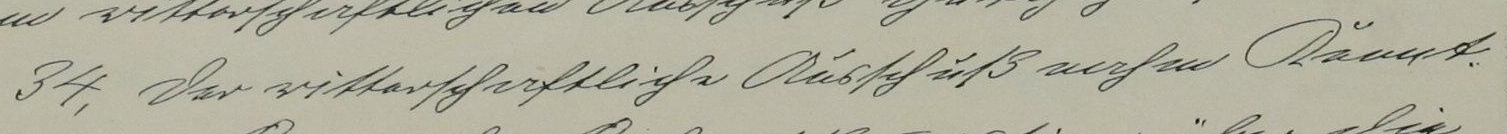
34. Der ritterschaftliche Ausschuß nahm Kennt-
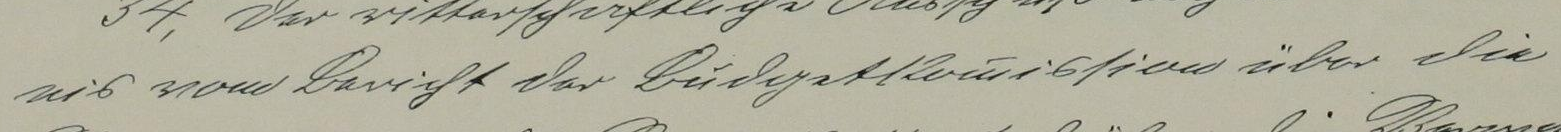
nis vom Bericht der Budgetkommission über die
